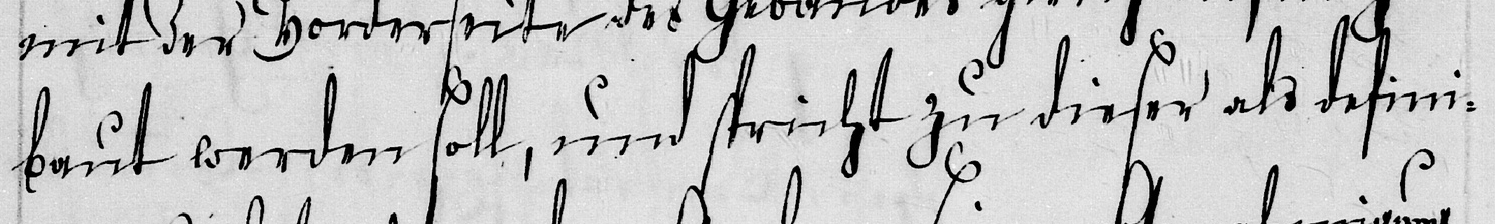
baut werden soll, und spricht zu dieser als defin¬
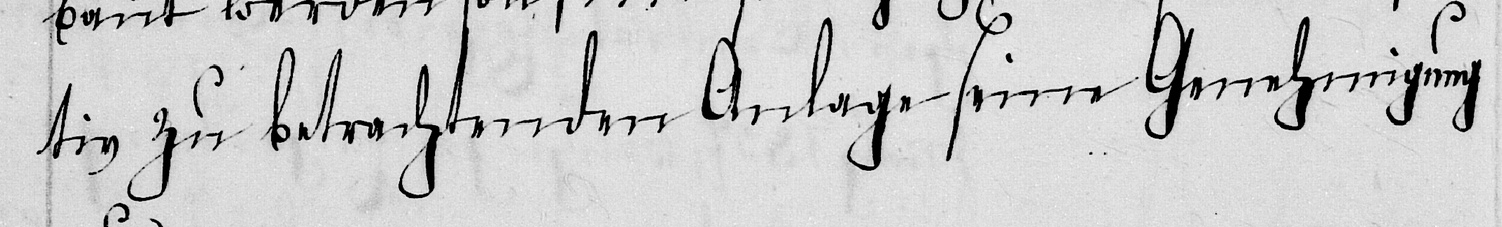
itiv zu betrachtenden Anlage seine Genehmigung
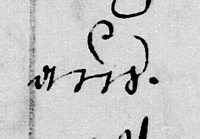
aus.
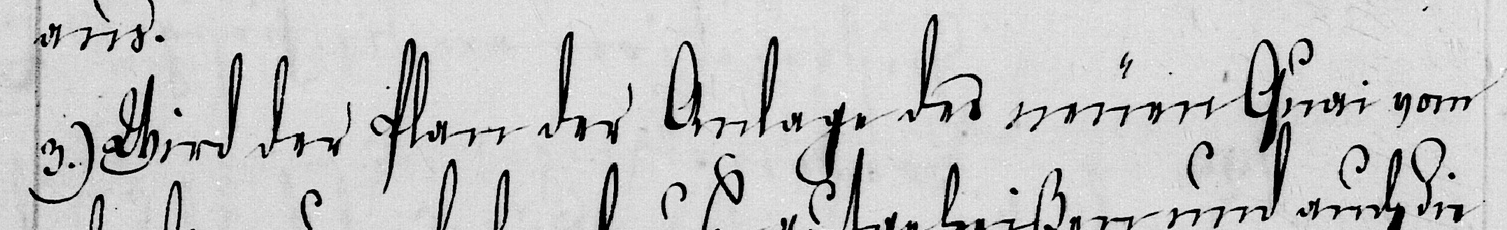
3.) Wird der Plan der Anlage des neuen Quai vom
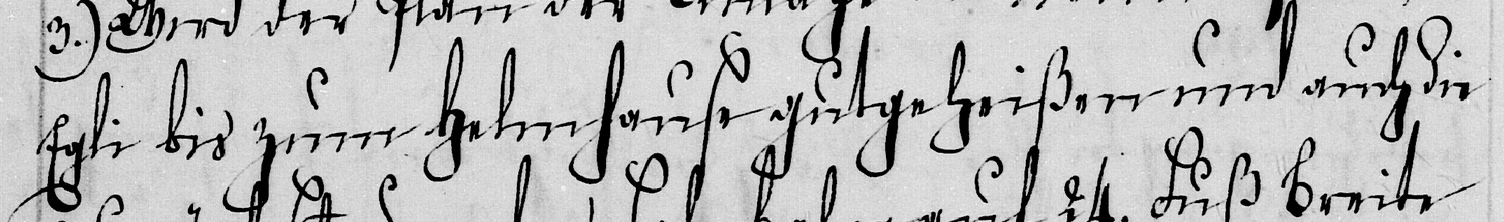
Egli bis zum Helmhause gutgeheißen und auch die
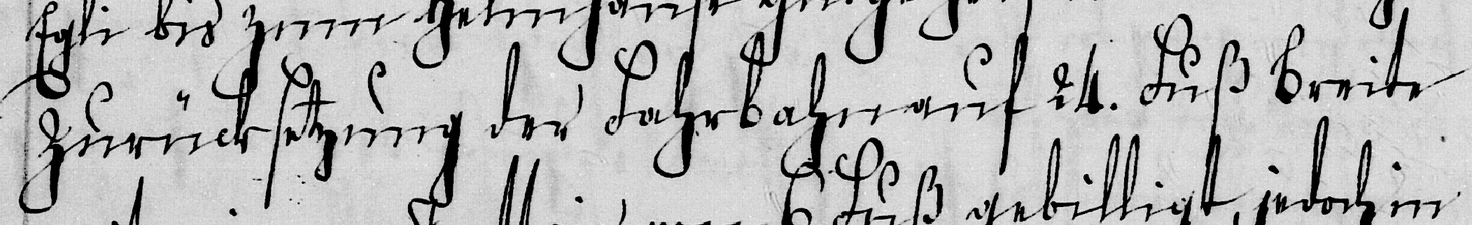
Zurücksetzung der Fahrbahn auf 24. Fuß Breite
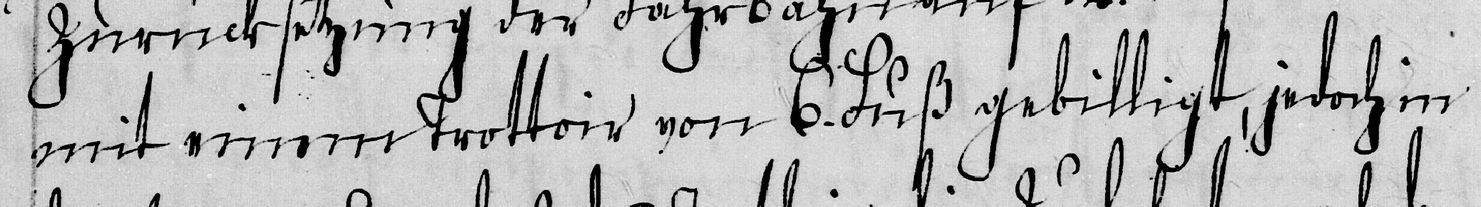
mit einem Trottoir von 6. Fuß gebilligt, jedoch in
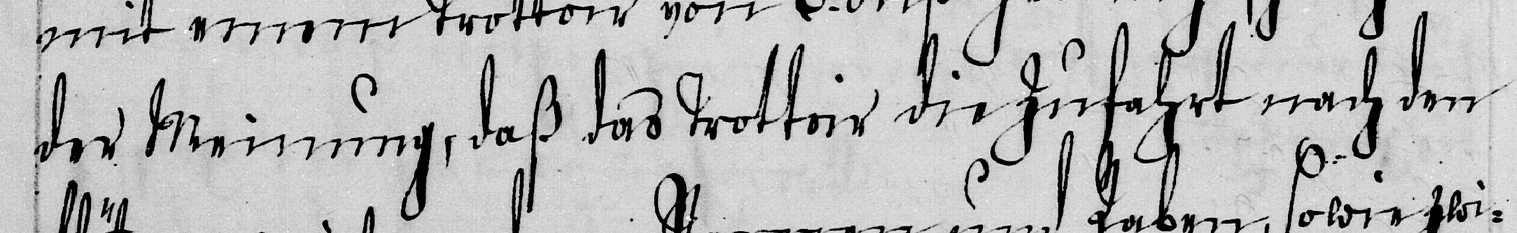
der Meinung, daß das Trottoir die Zufahrt nach den
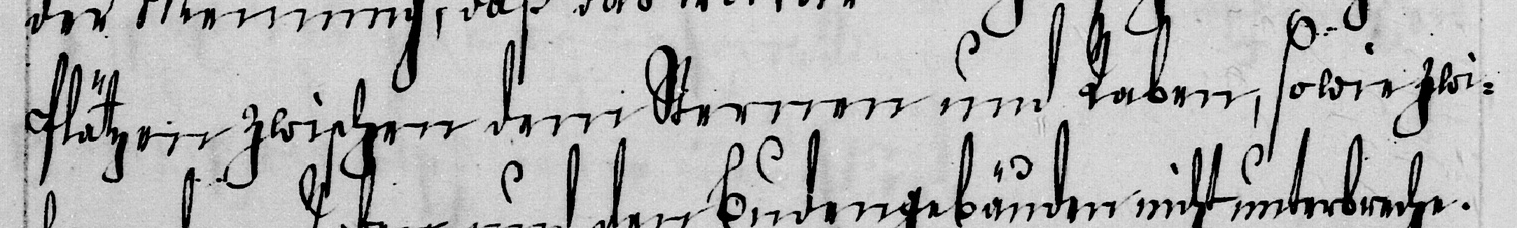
Plätzen zwischen dem Sternen und Raben, sowie zwi¬
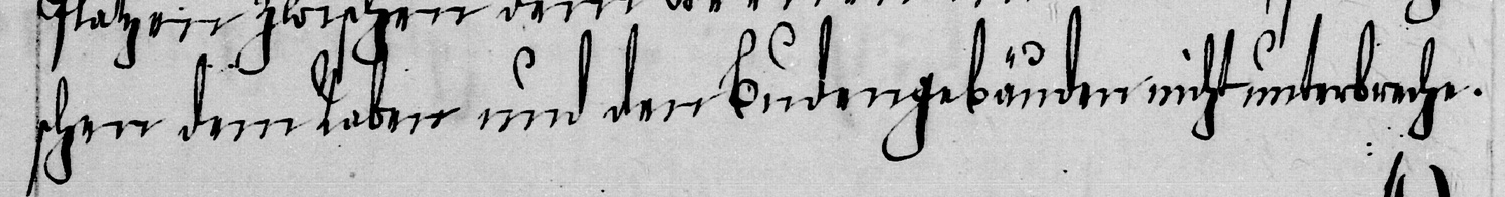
schen dem Raben und den Budengebäuden nicht unterbre¬
